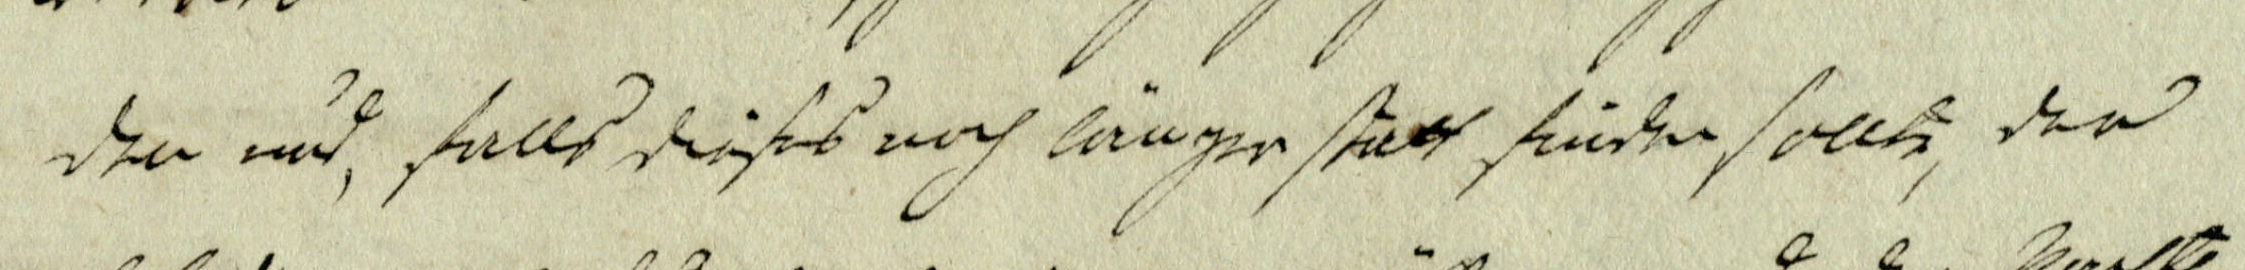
den und, falls dieses noch länger statt finden sollte, der
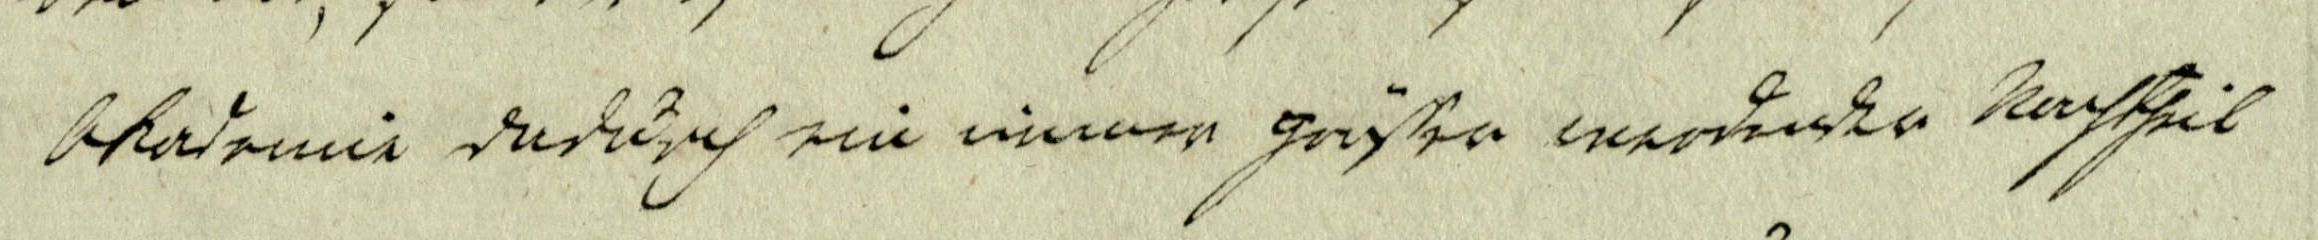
Akademie dadurch ein immer grösser werdender Nachtheil
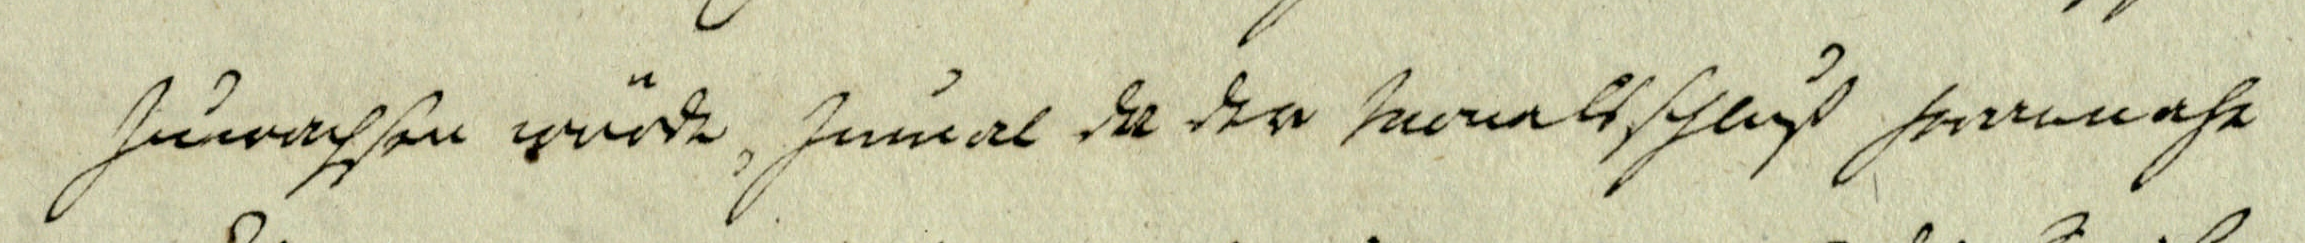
zuwachsen würde, zumal da der Monatsschluß herannahe
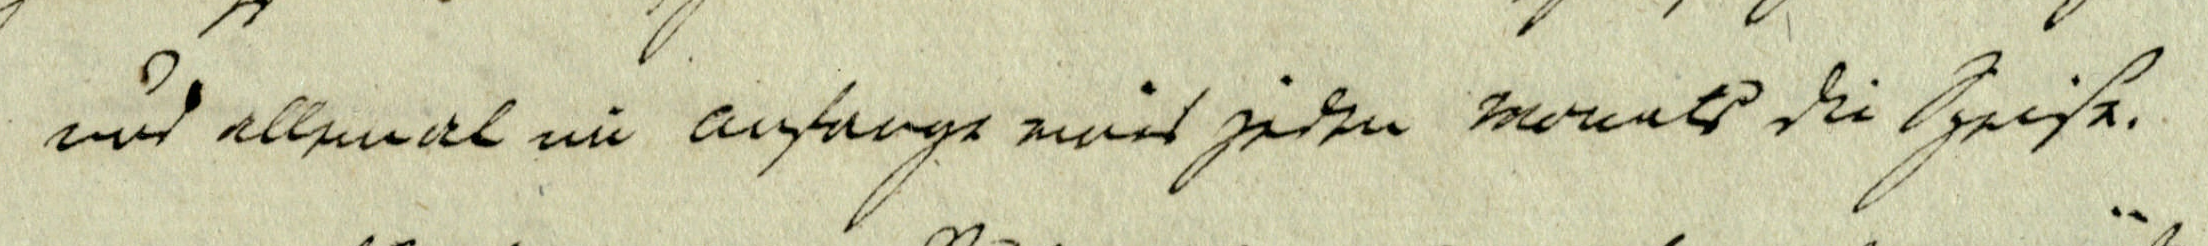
und allemal im Anfange eines jeden Monats die Speise¬
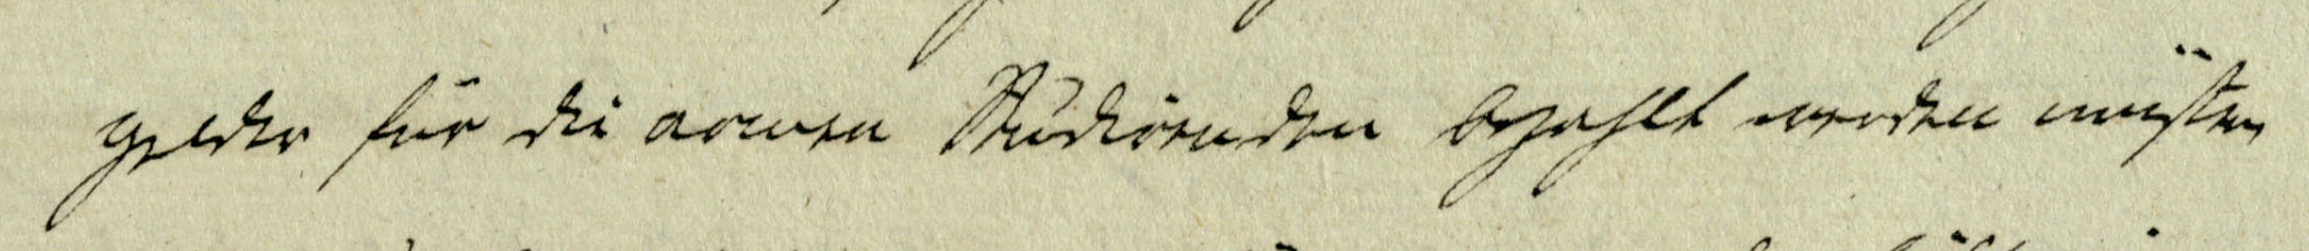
gelder für die armen Studirenden bezahlt werden müsten
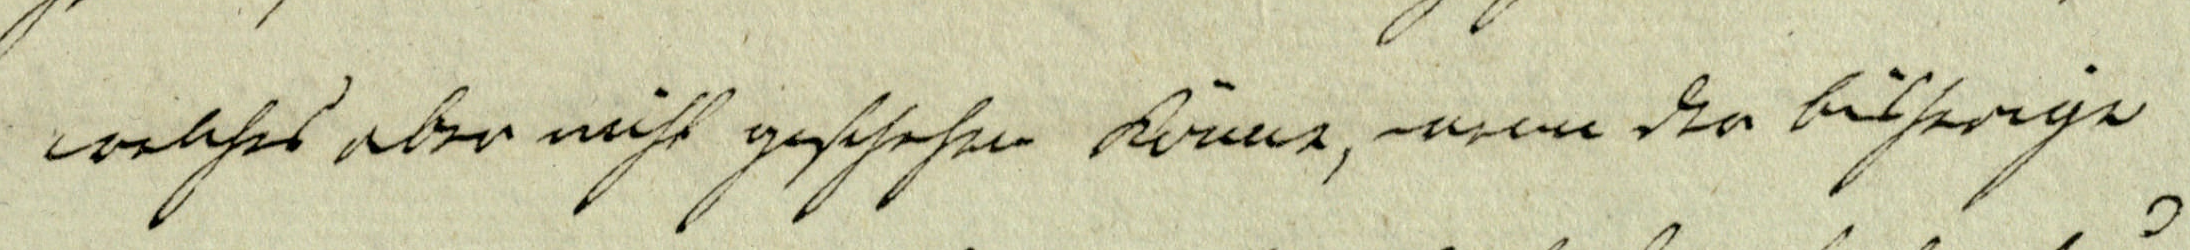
welches aber nicht geschehen könne, wenn der bisherige
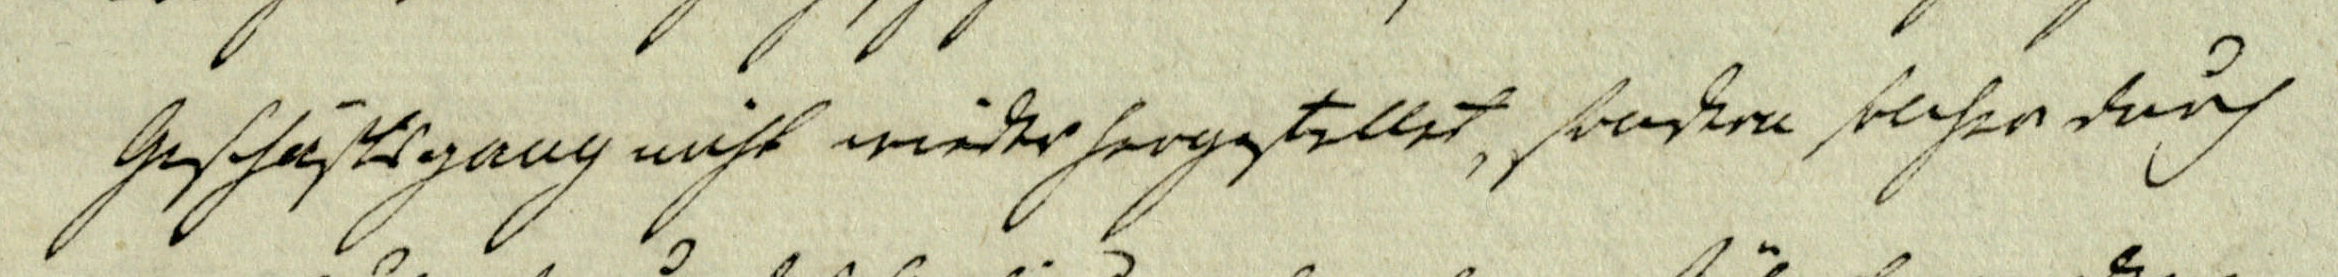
Geschäftsgang nicht wiederhergestellet, sondern solcher durch
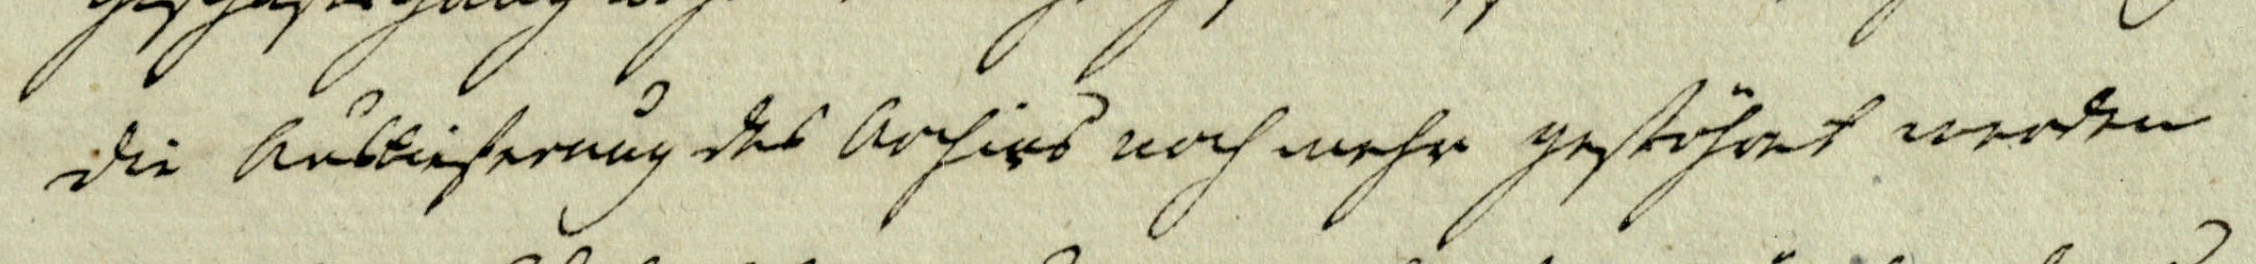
die Ablieferung des Archivs noch mehr gestöhret werden
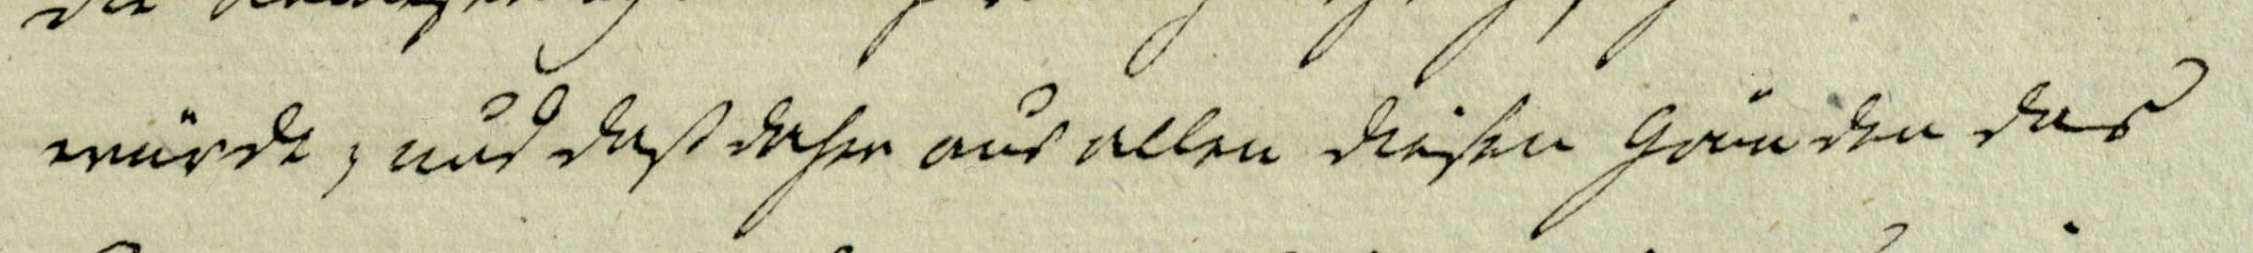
würde; und daß daher ans allen diesen Gründen das
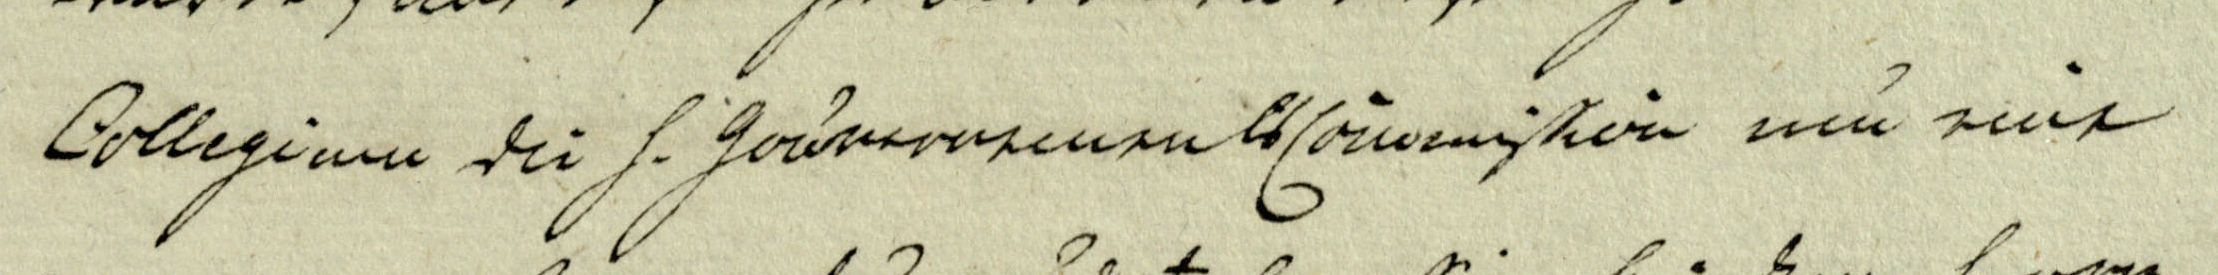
Collegium die h. Gouvernements Commission um eine
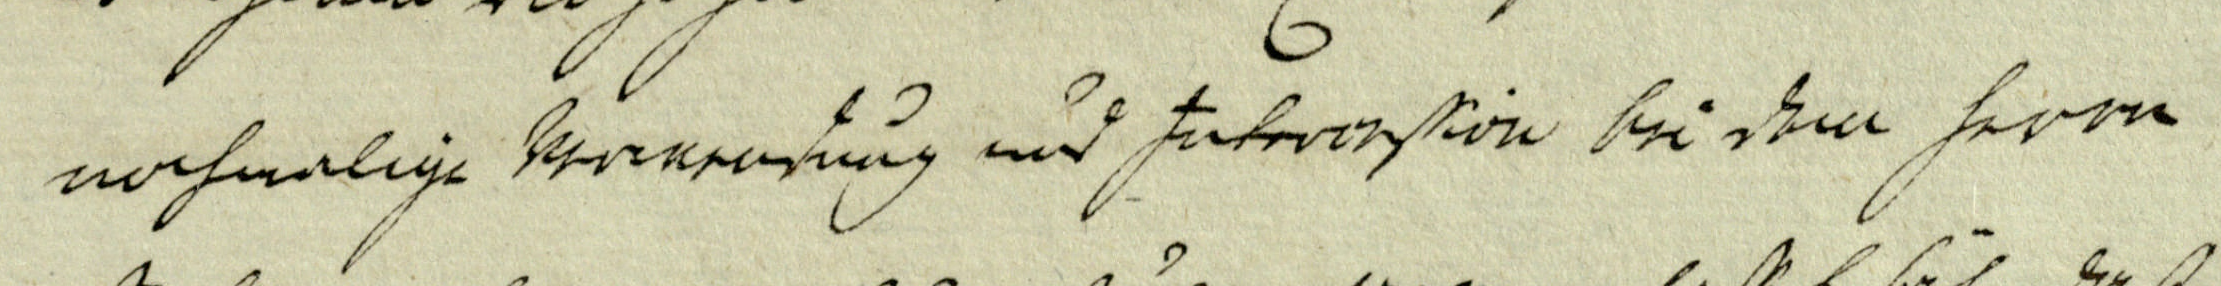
nochmalige Verwendung und Intercession bei dem Herrn
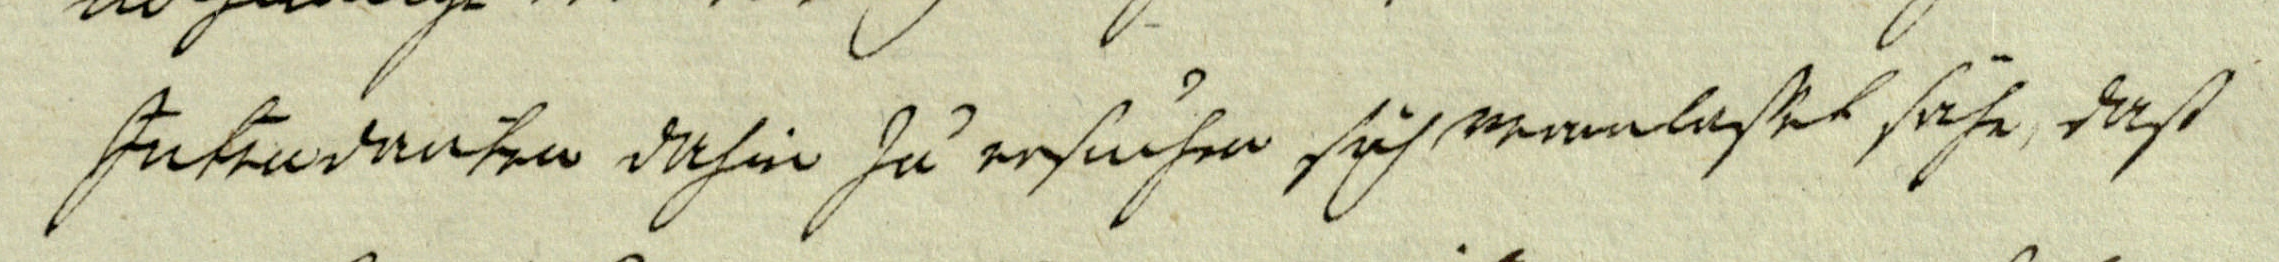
Intendanten dahin zu ersuchen sich veranlasset sähe daß
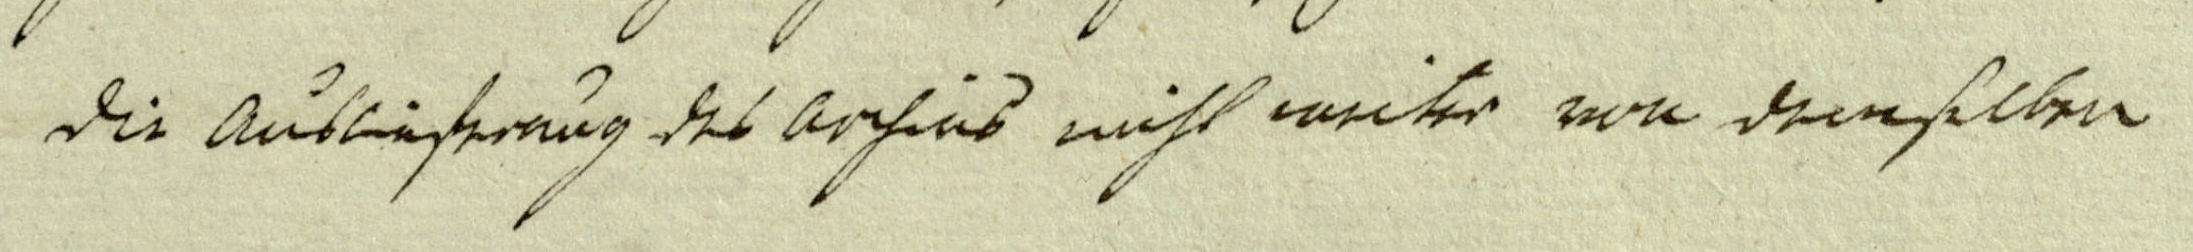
die Auslieferung des Archivs nicht weiter von demselben
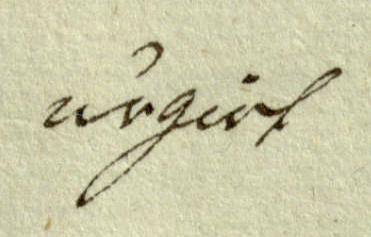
urgirt
